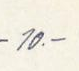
10
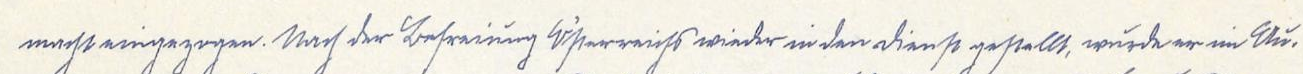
macht eingezogen. Nach der Befreiung Österreichs wieder in den Dienst gestellt, wurde er im Au-
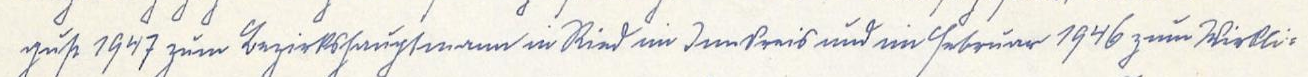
gust 1947 zur zum Bezirkshauptmann in Ried im Innkreis und im Februar 1946 zum Wirkli-
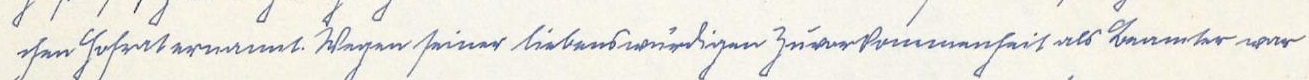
chen Hofrat ernannt. Wegen seiner liebenswürdigen Zuvorkommenheit als Beamter war
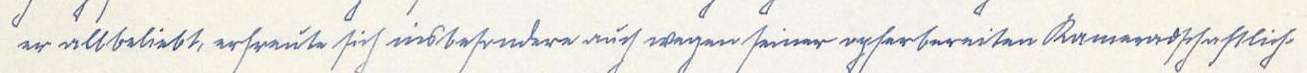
er allbeliebt, erfreute sich insbesondere auch wegen seiner opferbereiten kameradschaftlich-
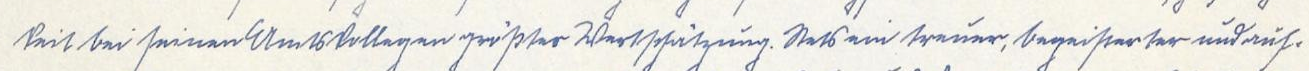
keit bei seinen Amtskollegen größter Wertschätzung. Stets ein treuer, begeisterter und auf-
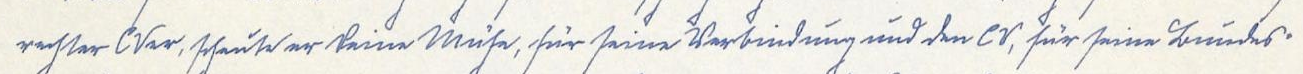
rechter CVer, scheute er keine Mühe, für seine Verbindung und den CV, für seine Bundes-
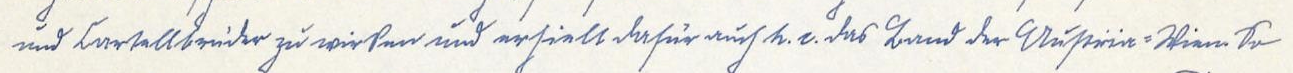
und Cartellbrüder zu wirken und erhielt dafür auch h.c. das Band der Austria – Wien. So
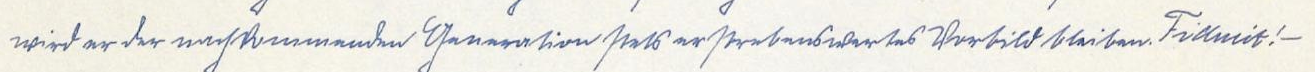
wird er der nachkommenden Generation stets erstrebenswertes Vorbild bleiben. Fiducit! –
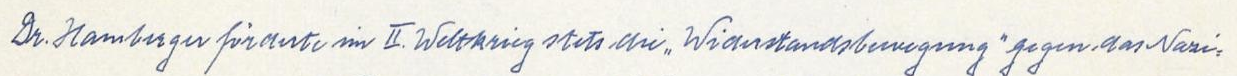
Dr. Hamberger förderte im II. Weltkrieg stets die „Widerstandsbewegung“ gegen das Nazi-
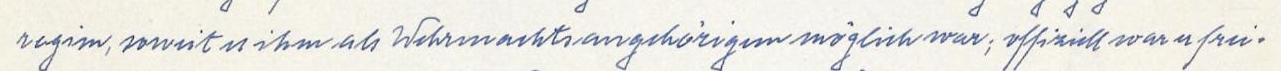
regim, soweit es ihm als Wehrmachtangehöriger möglich war; Offiziell war er frei-
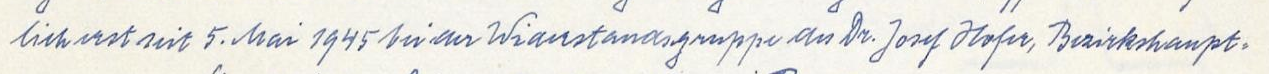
lich erst seit 15. Mai 1945 bei der Widerstandsgruppe des Dr. Josef Hofer, Bezirkshaupt-
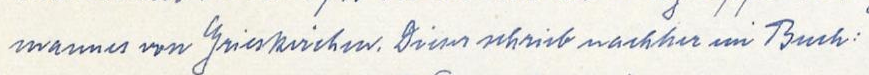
mannes von Grieskirchen. Dieser schrieb nachher im Buch:
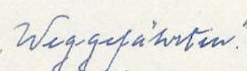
„Weggefährten“
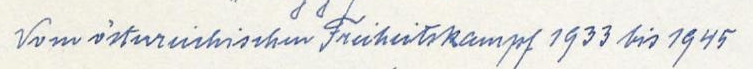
Vom österreichischen Freiheitskampf 1933 bis 1945
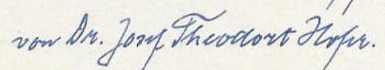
von Dr. Joseph Theodor Hofer.
